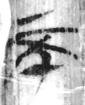不
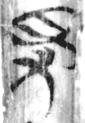𠭁
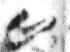㠯（以）
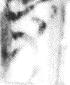又（有）
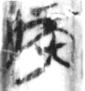疾
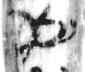卯
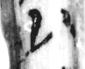少
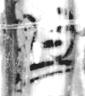翏（瘳）
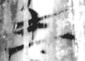生
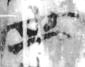才（在）
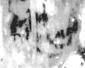申
